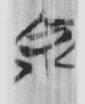余
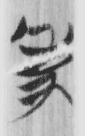事
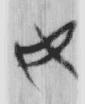女
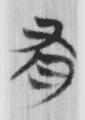有
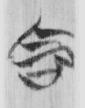命
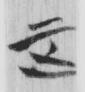正
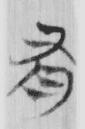有
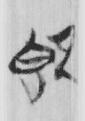即
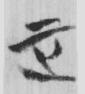正
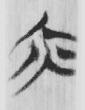亦
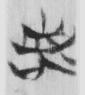若
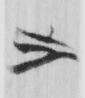之
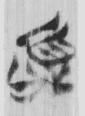頌
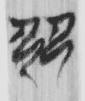弜
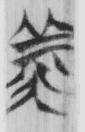羕
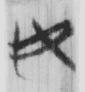女
